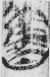魯
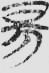昜（陽）
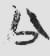公
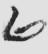㠯（以）
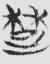楚
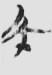帀（師）
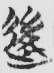○（後）
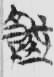城
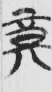奠
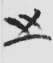之
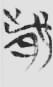歲（歲）
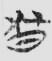冬（冬）
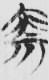○（夕）
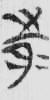之月
